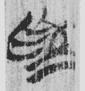爲
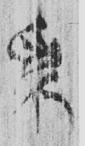奚
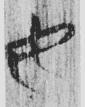女（如）
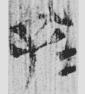孔子
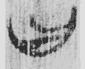曰
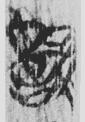䌛（由）
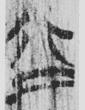丘
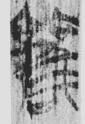觀
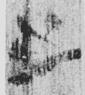之
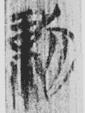則
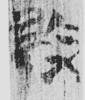{𡵂攴}（微）
